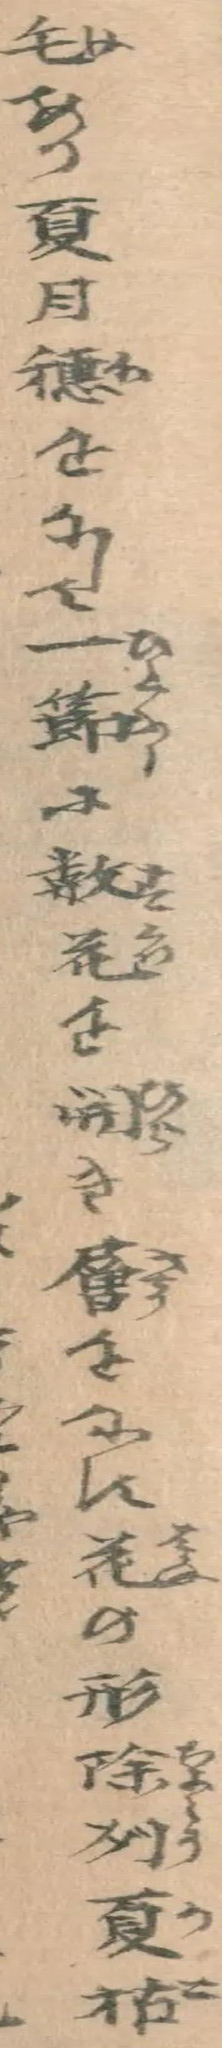毛あり夏月穂をなして一節に数花を開き層をなす花の形除州夏枯
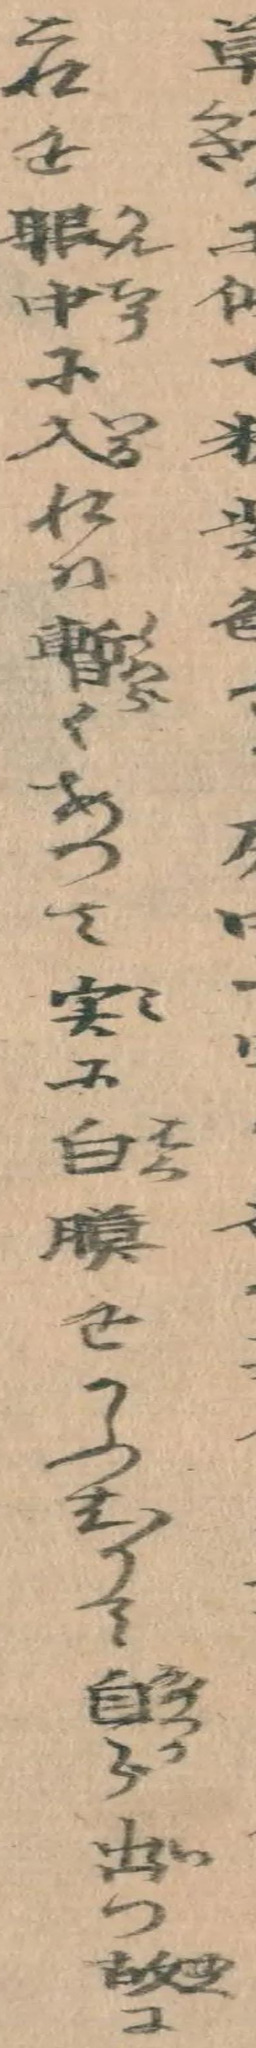これを眼中に入れは暫くあつて実に白膜をかふむりて自ら出つ故に
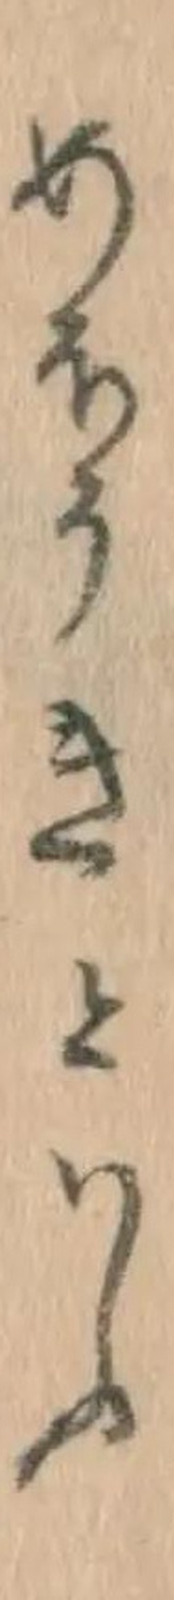めほうきといふ
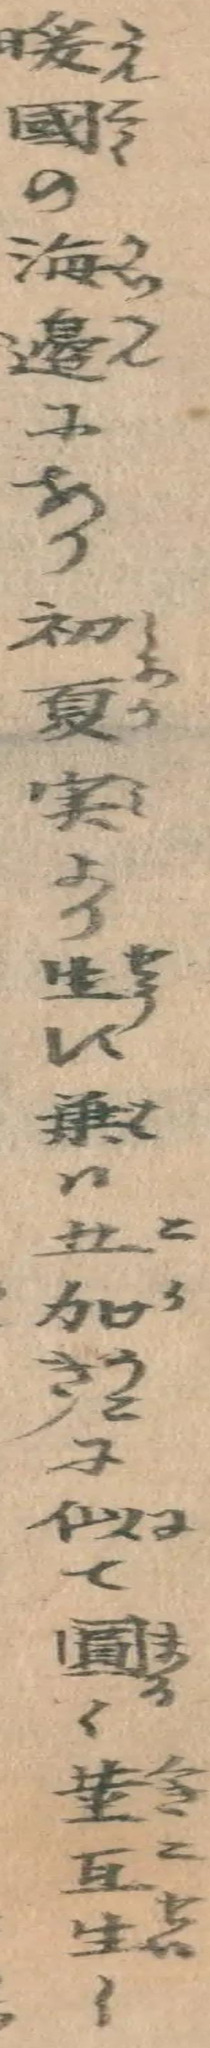暖国の海辺にあり初夏実より生す葉は五加うこきに似て円く茎互生し
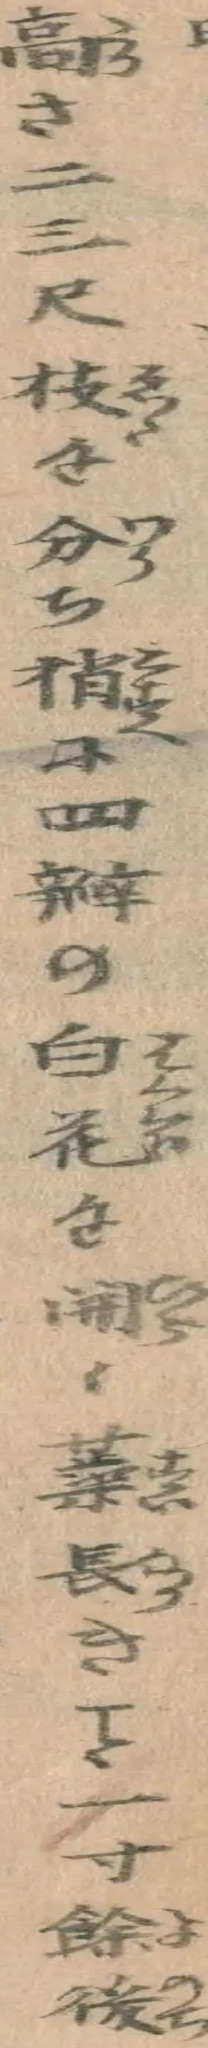高さ二三尺枝を分ち梢に四弁の白花を開く蕊長きこと一寸余後
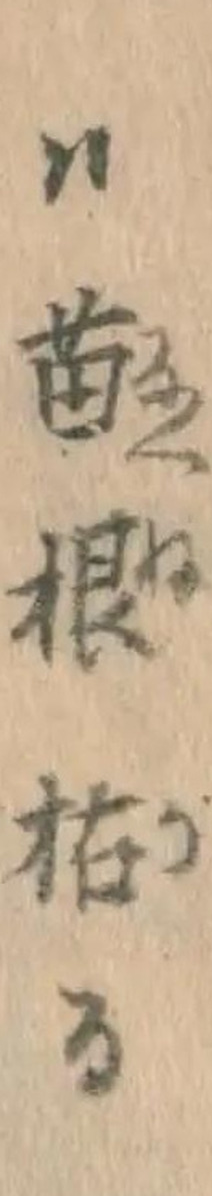は苗根枯る

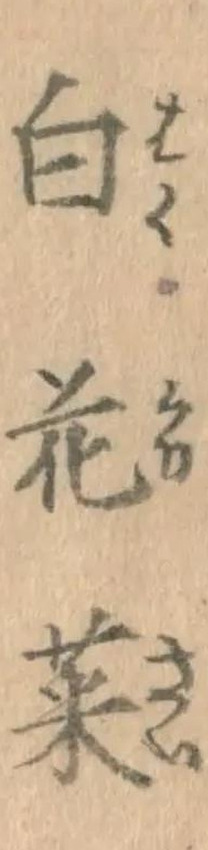白花菜

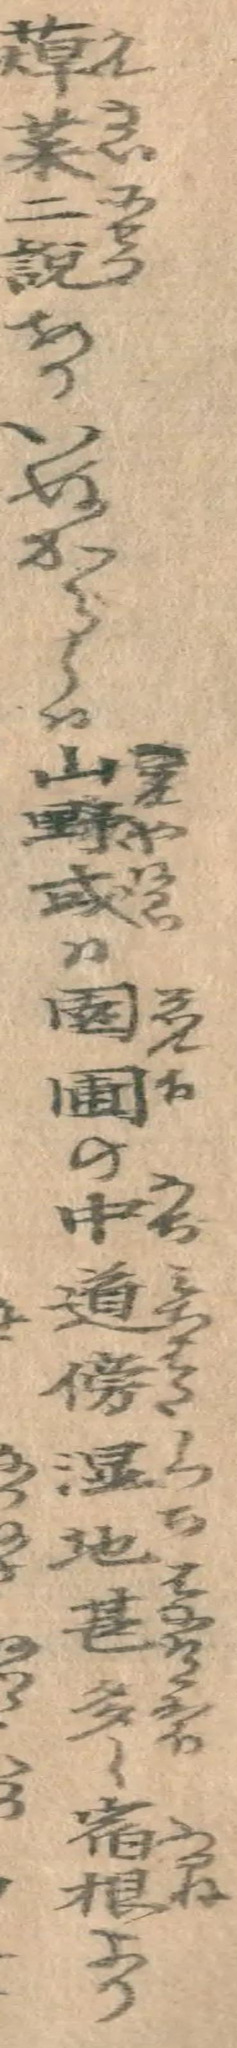蔊菜二説ありいぬからしは山野或は園圃の中道傍湿地甚多し宿根より
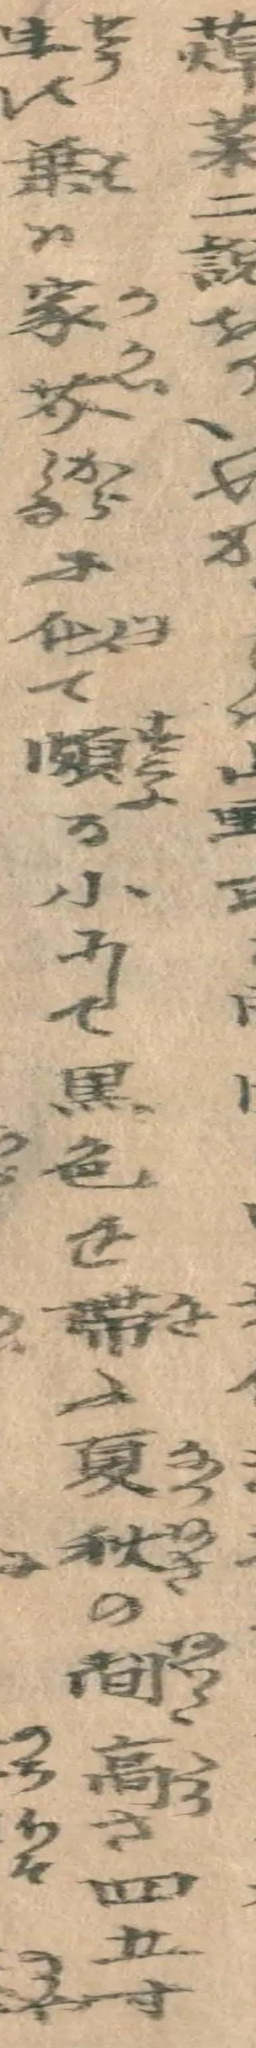生す葉は家芥からしなに似て頗る小にして黒色を帯ふ夏秋の間高さ四五寸
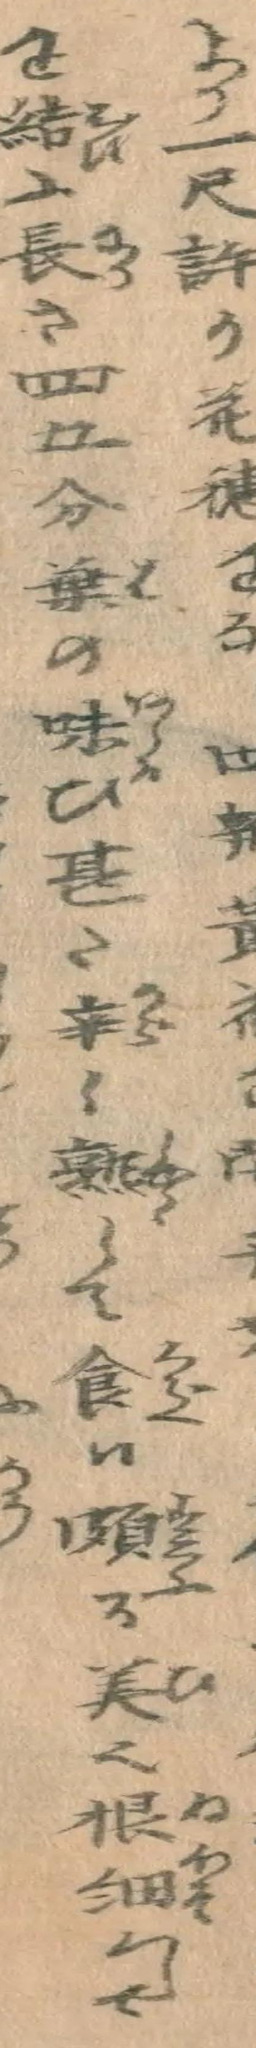を結ふ長さ四五分葉の味ひ甚た辛し熟して食は頗る美也根細くして
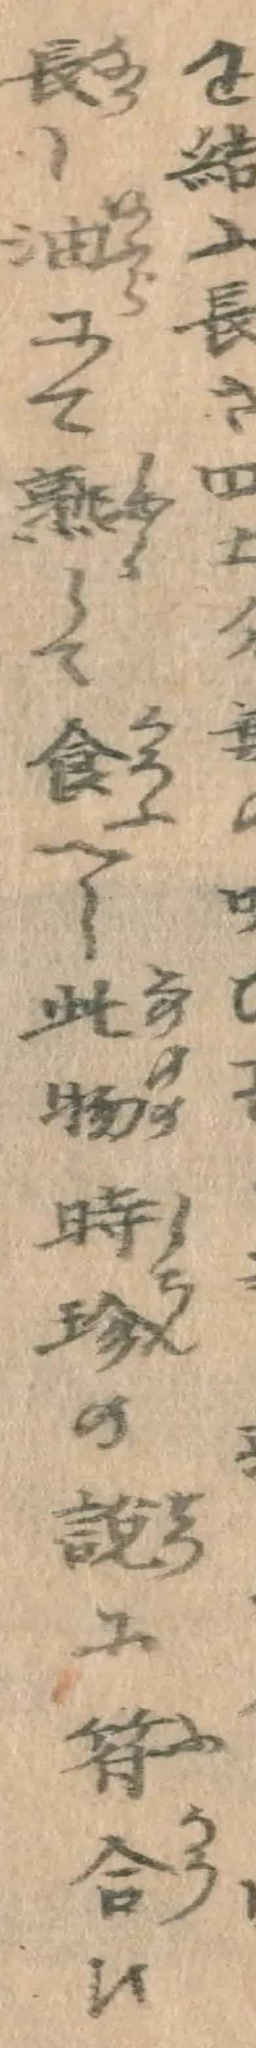長し油にて熟して食へし此物時珍の説に符合す
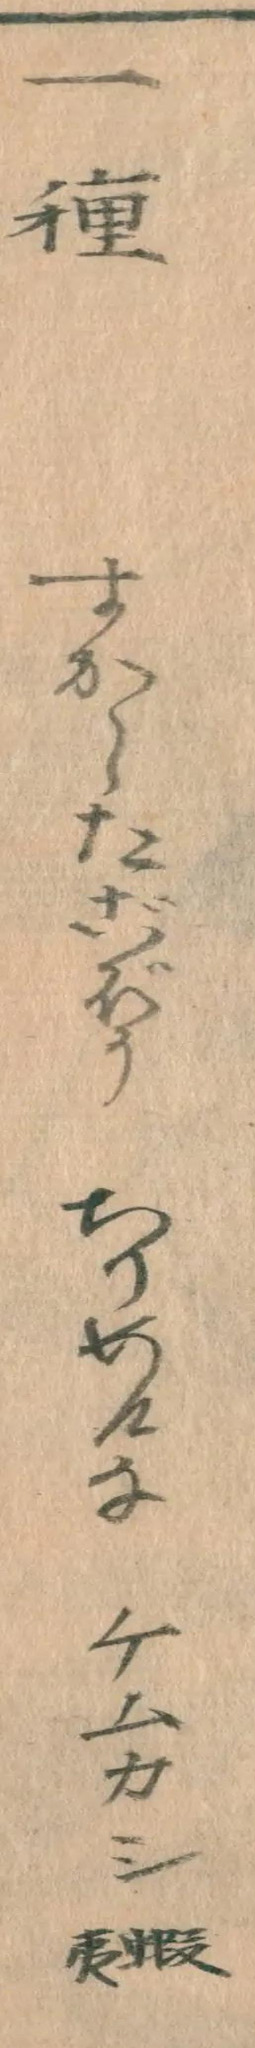一種すかしたごぼうちりめんなケムカシ蝦夷
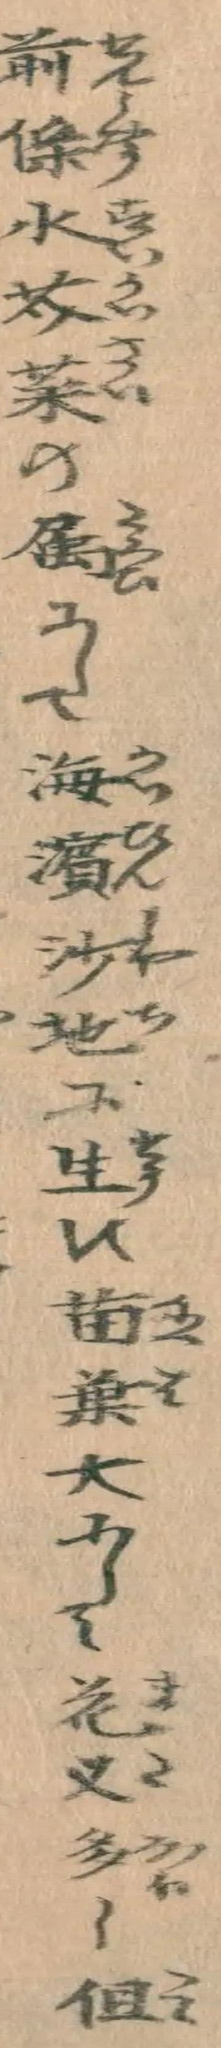前条水芥菜の属にして海浜沙地に生す苗葉大にして花叉多し但
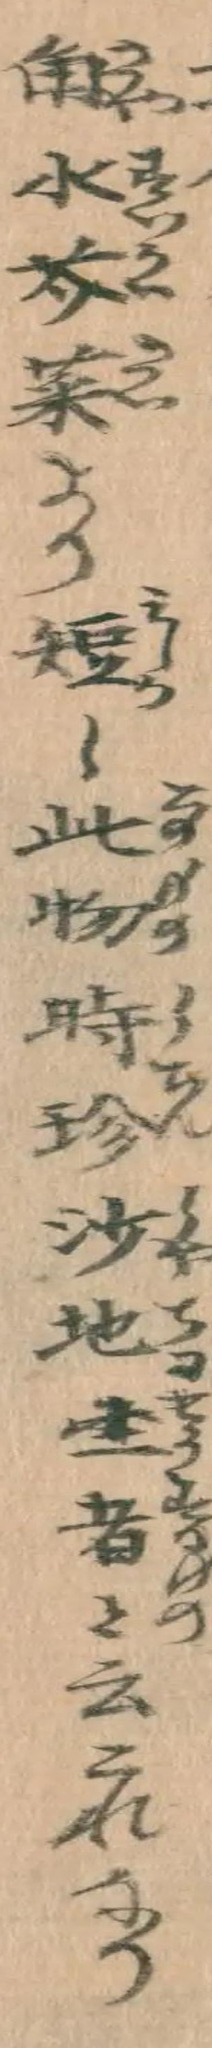角水芥菜より短し此物時珍沙地生者と云これなり

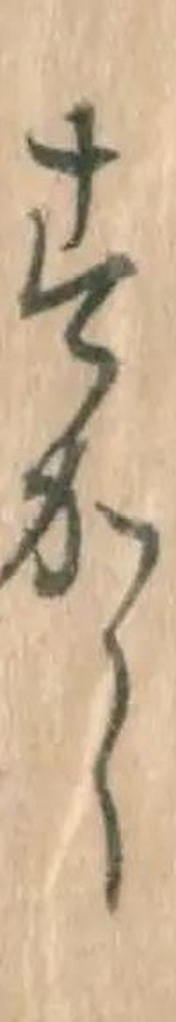すかし
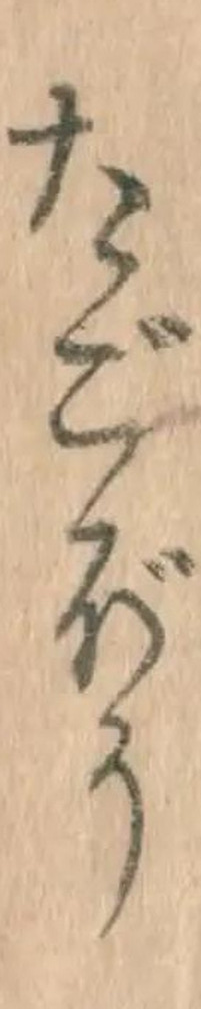たごぼう
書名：本草図譜. 巻46-48
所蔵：国立国会図書館 National Diet Library, JAPAN
